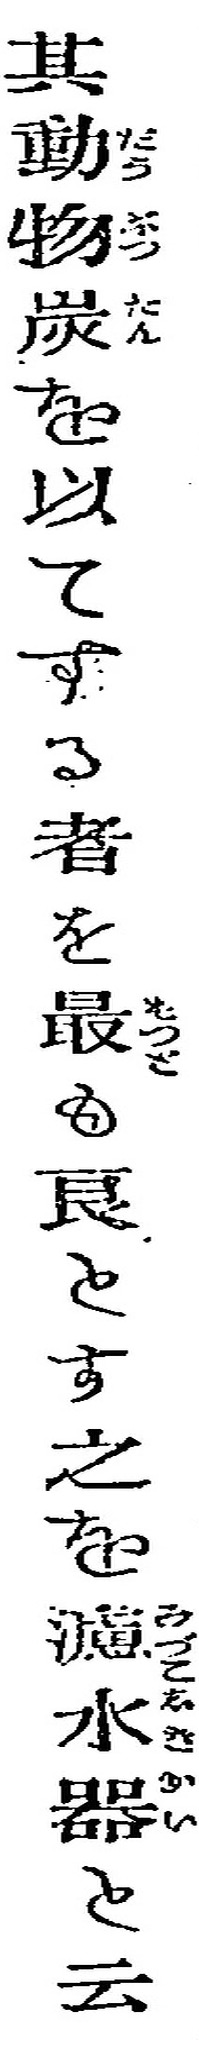其動物炭を以てする者を最も良とす之を濾水器と云
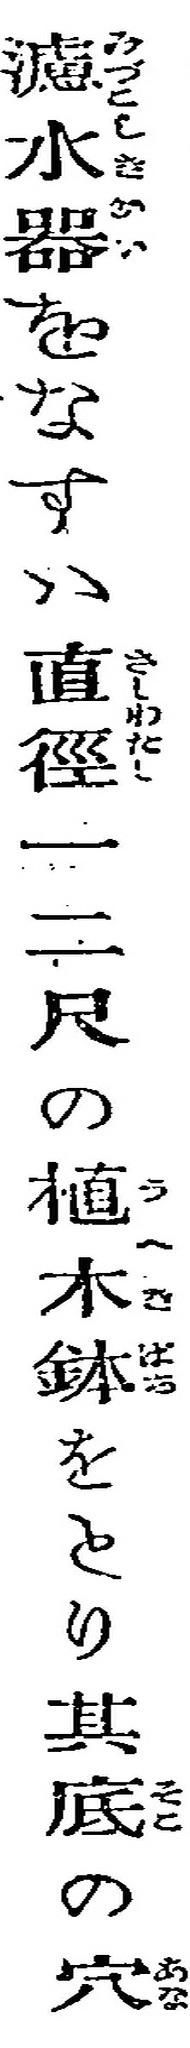濾水器をなすは直径一二尺の植木鉢をとり其底の穴
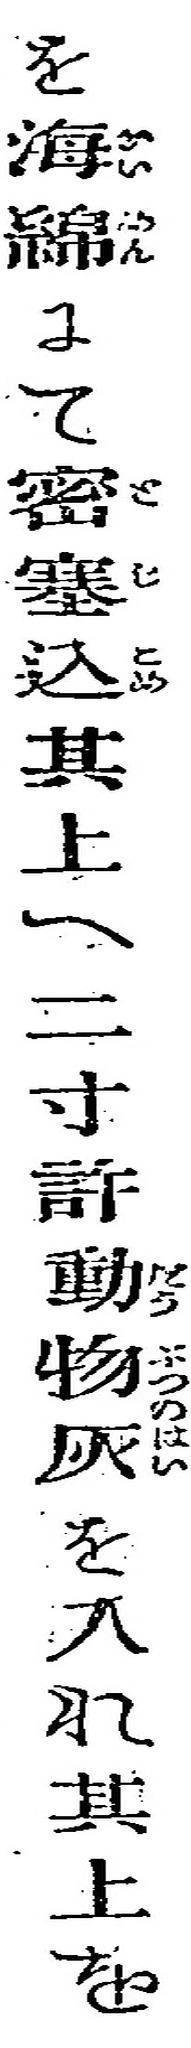を海綿にて密塞込其上へ二寸許動物灰を入れ其上を
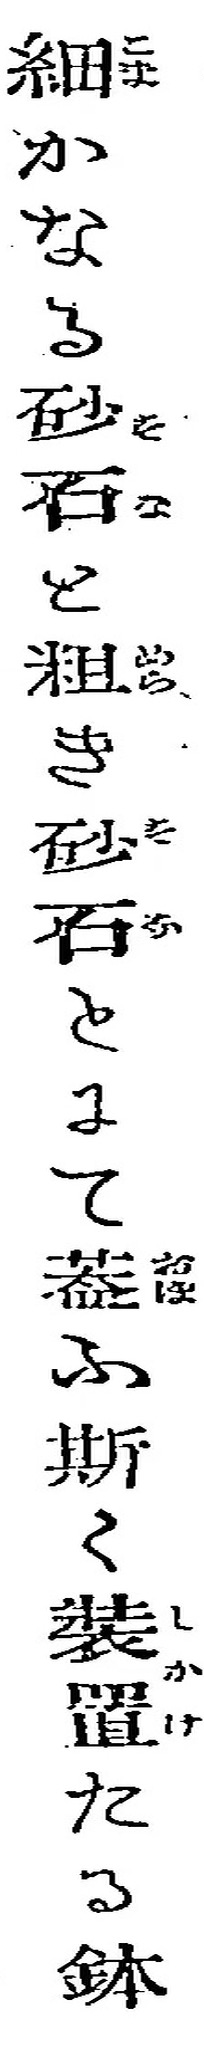細かなる砂石と粗き砂石とにて葢ふ斯くそうちたる鉢
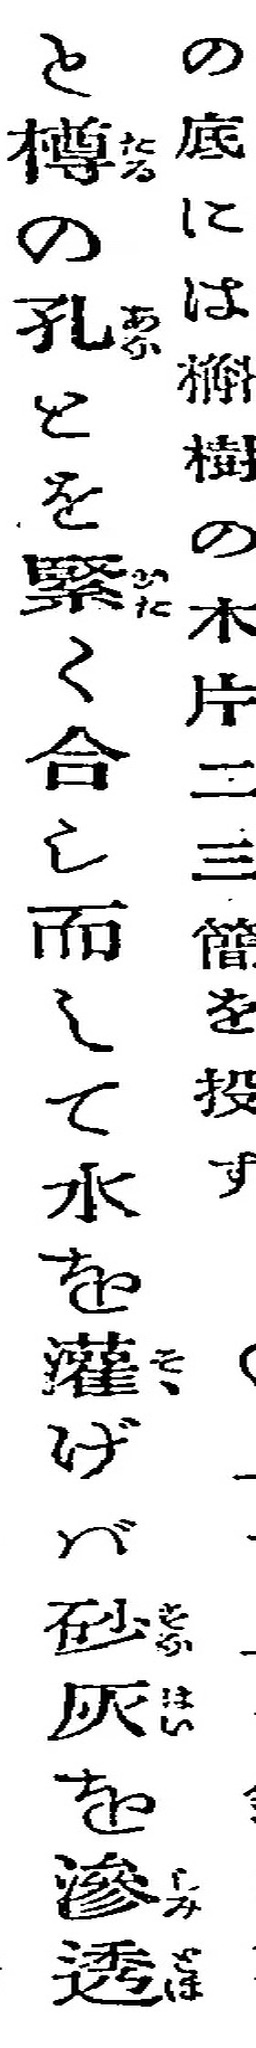と樽の孔とを緊く合し而して水を灌げば砂灰を滲透
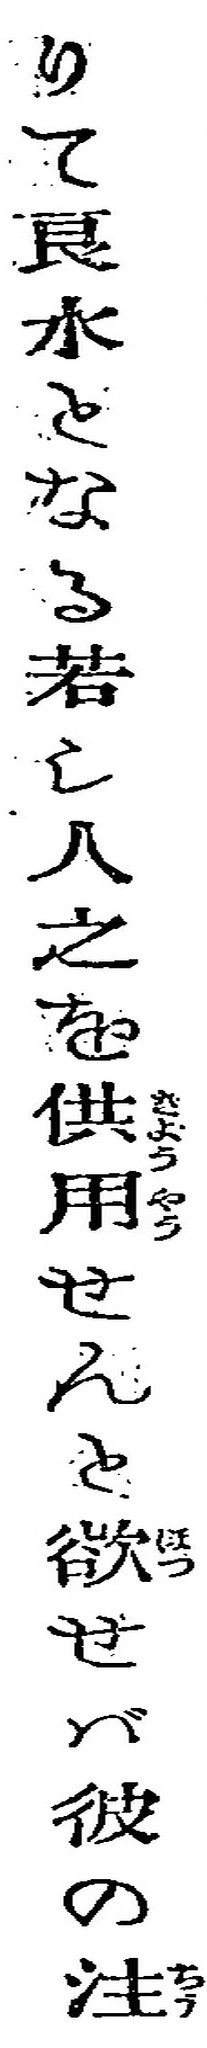りて良水となる若し人之を供用せんと欲せば彼の注

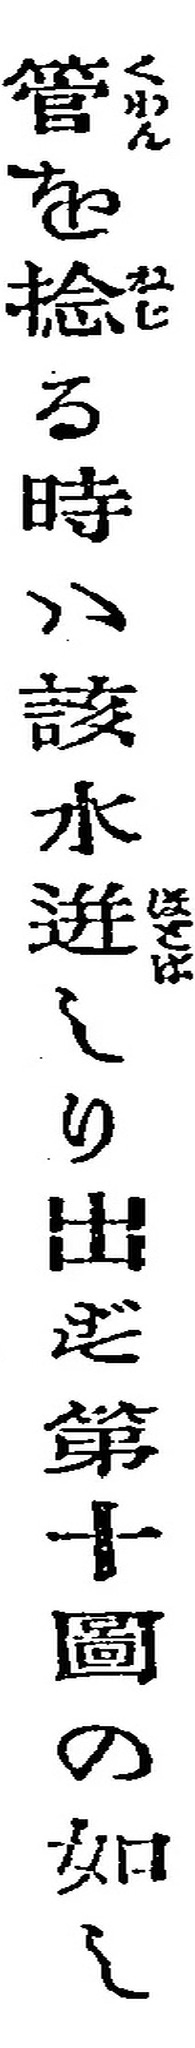管を捻る時は該水迸しり出ず第十圖の如し
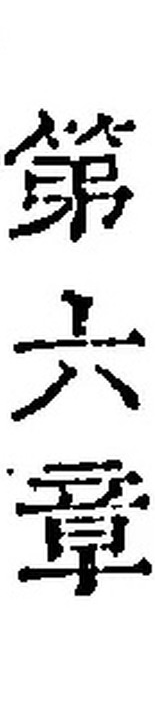第六章
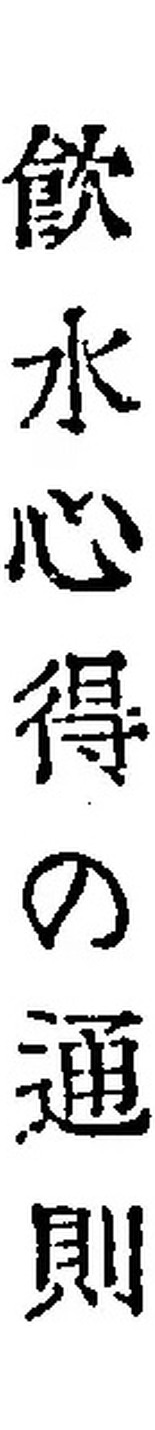飲水心得の通則
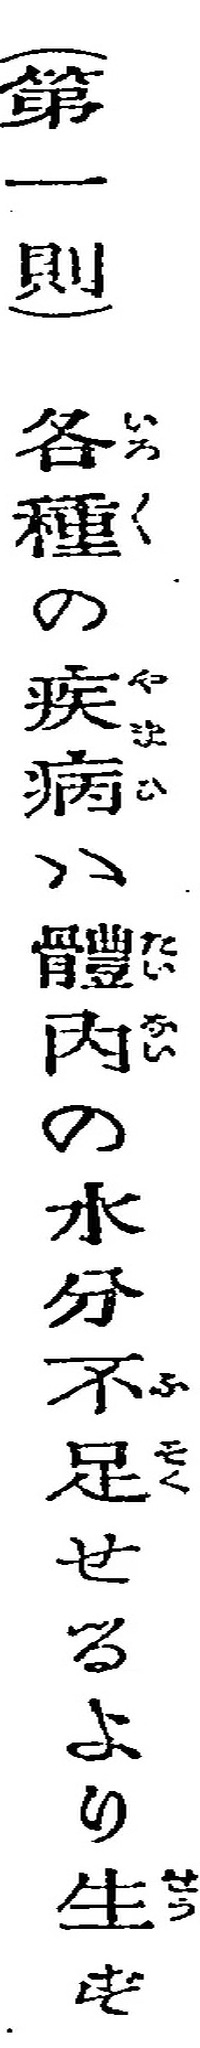[第一則]各種疾病は體内の水分不足せるより生ず
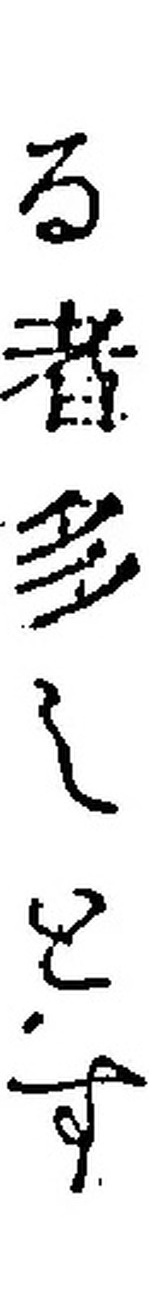る者多しとす
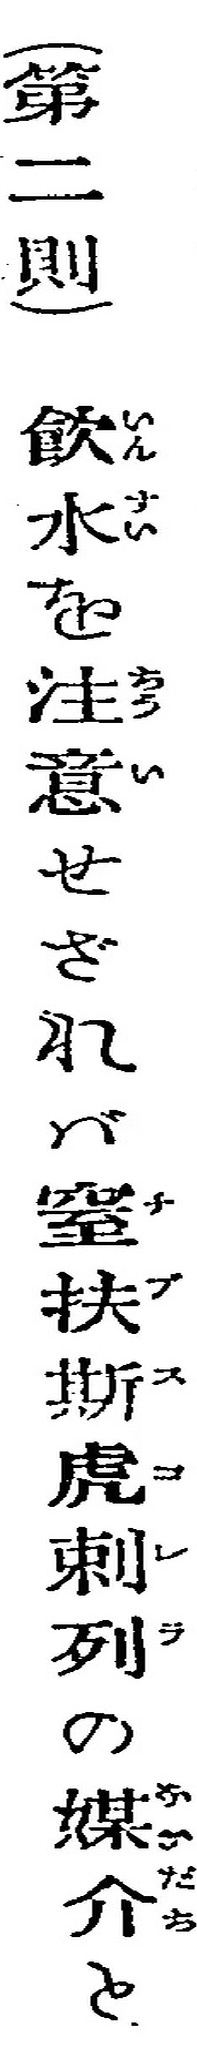[第二則]飲水を注意せざれば窒扶斯虎列刺の媒介と
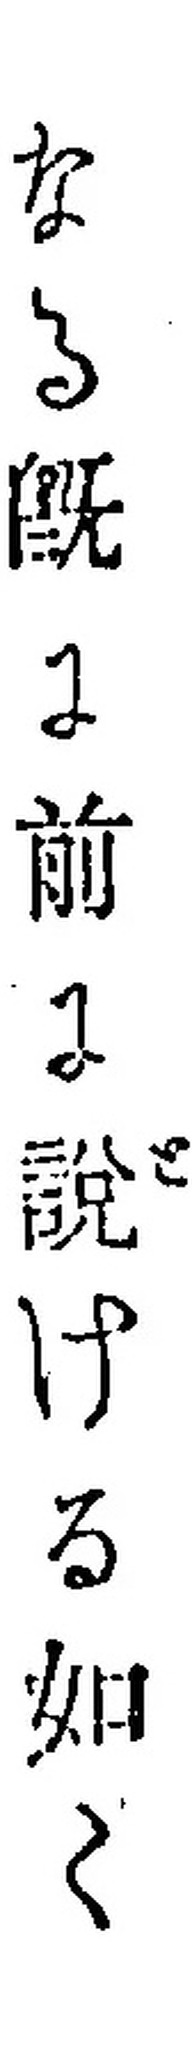なる既に前に説ける如く
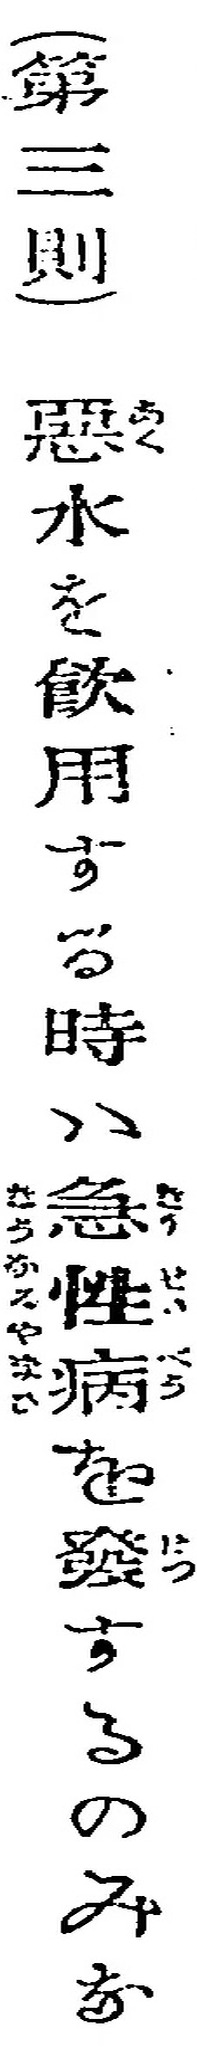[第三則]惡水を飲用する時は急性病を發するのみな
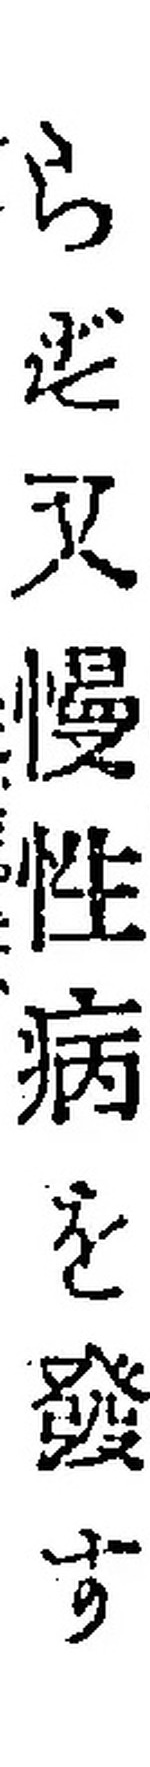らず又慢性病を發す
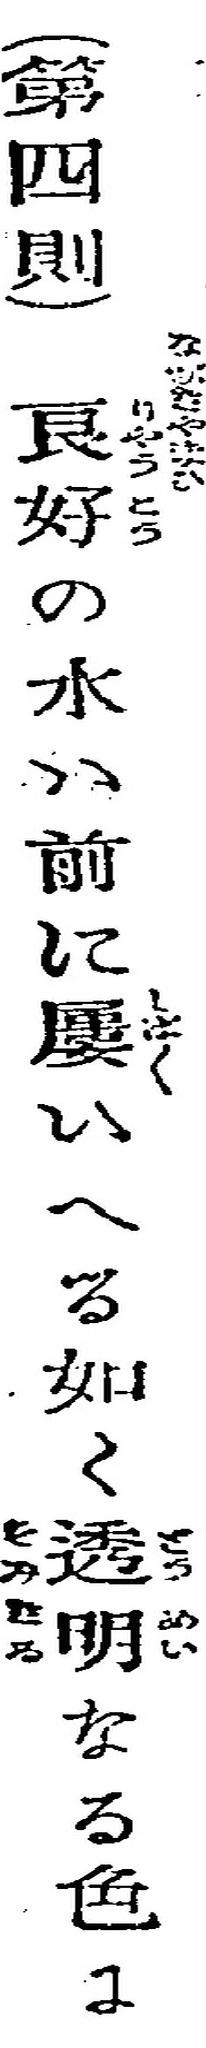[第四則]良好の水は前に屡々いへる如く透明なる色に
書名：飲水の心得 : 伝染病の予防
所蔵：国立国会図書館 National Diet Library, JAPAN
